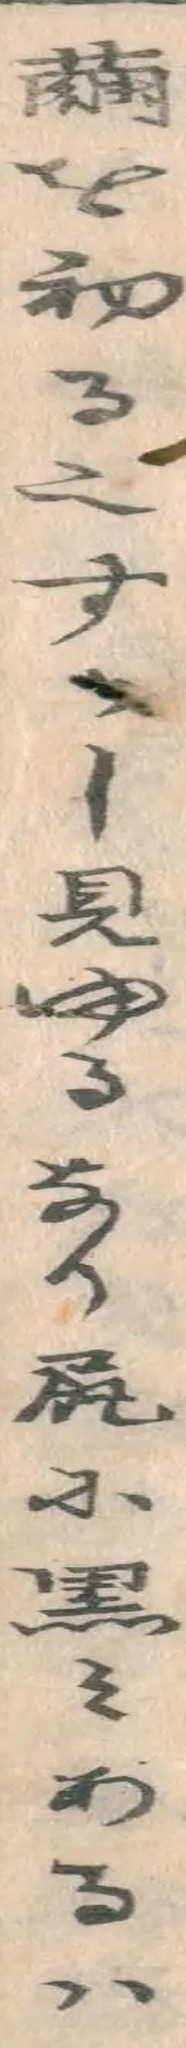繭を初る也すかし見ゆるなり尻に黒みあるは

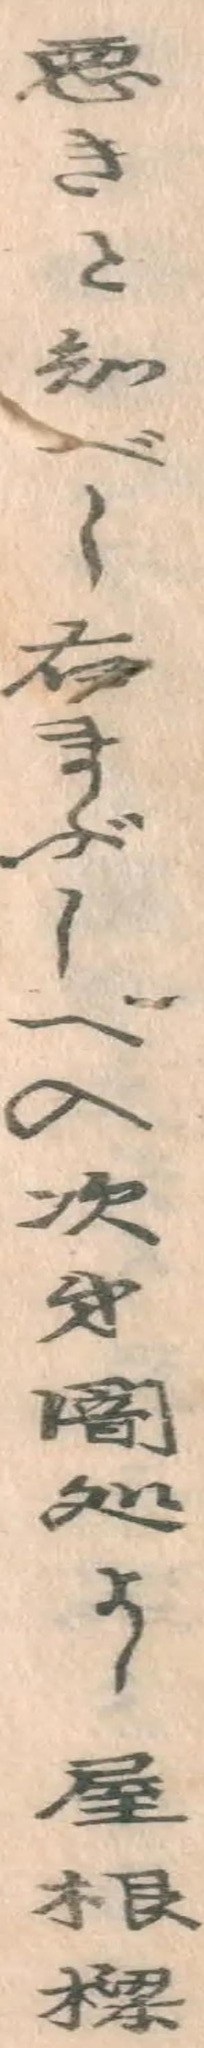悪きと知べし右まぶしへ入次第闇処よし屋根樑
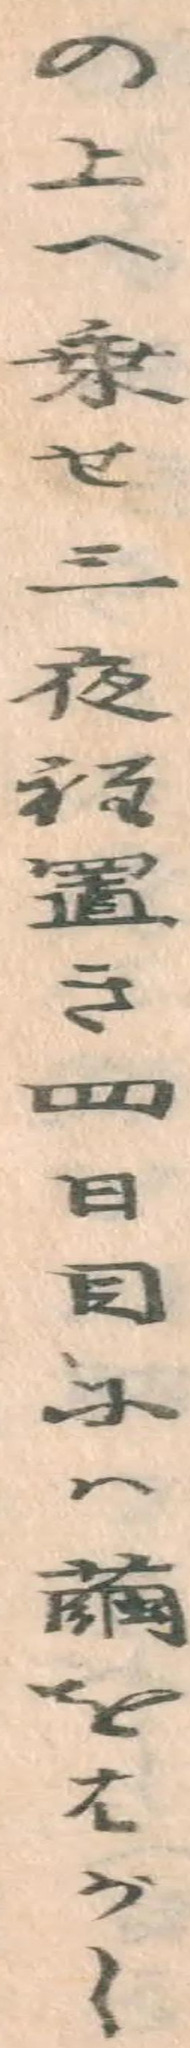の上へ乗せ三夜程置き四日目には繭をはかし
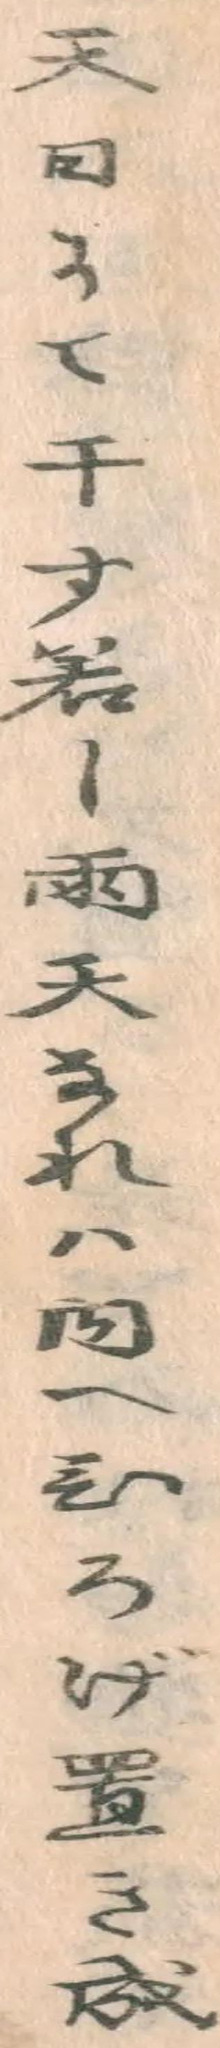天日にて干す若し雨天なれは内へひろげ置き成
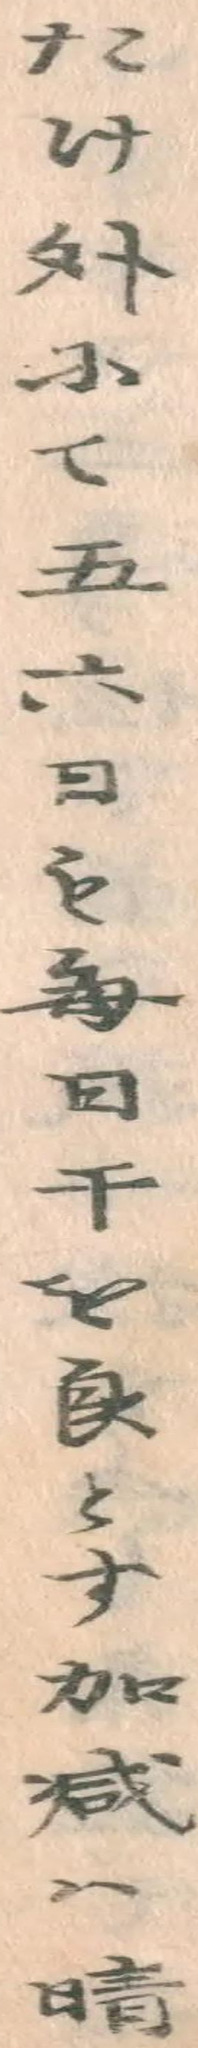たけ外にて五六日も毎日干を良とす加減は晴
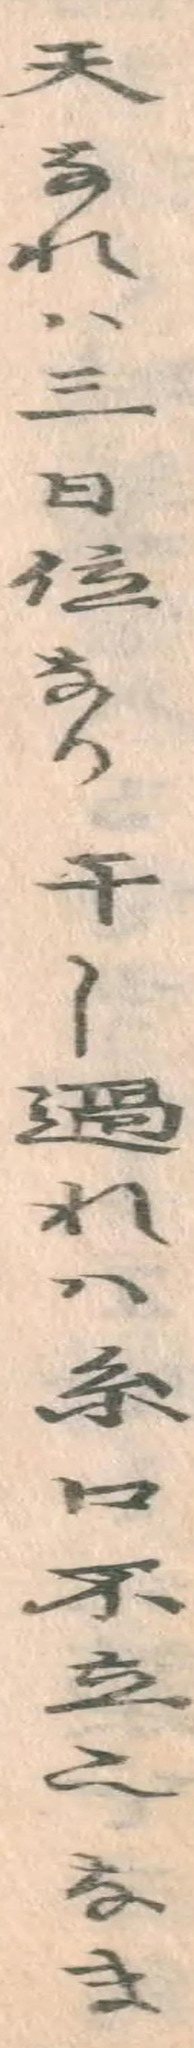天なれは三日位なり干し過れは糸口不立也なま
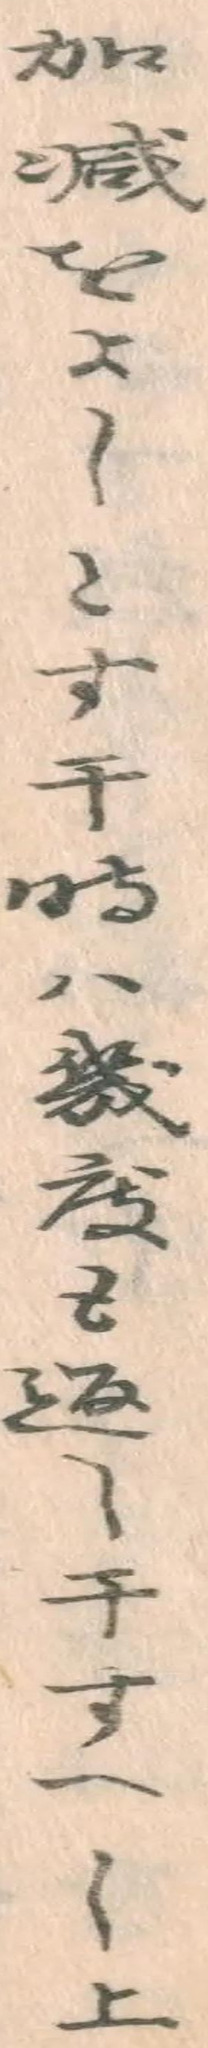加減をよしとす干時は幾度も返し干すへし上
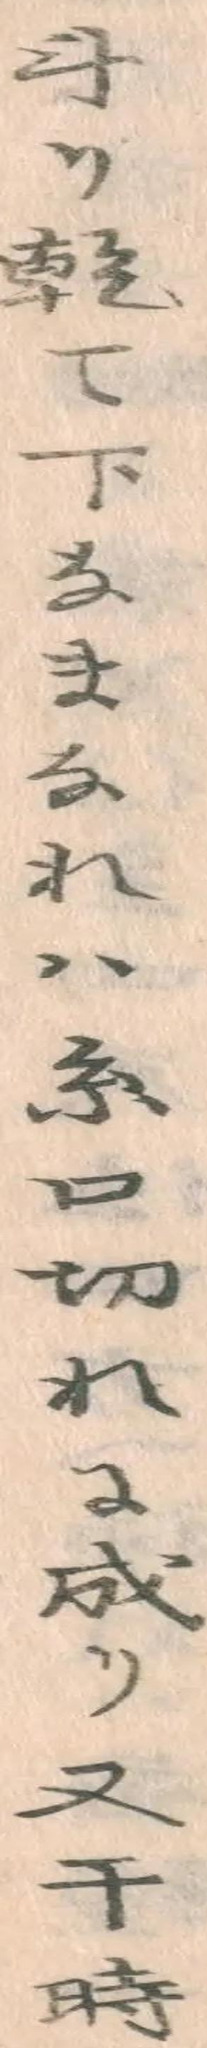斗り乾て下なまなれは糸口切れに成り又干時
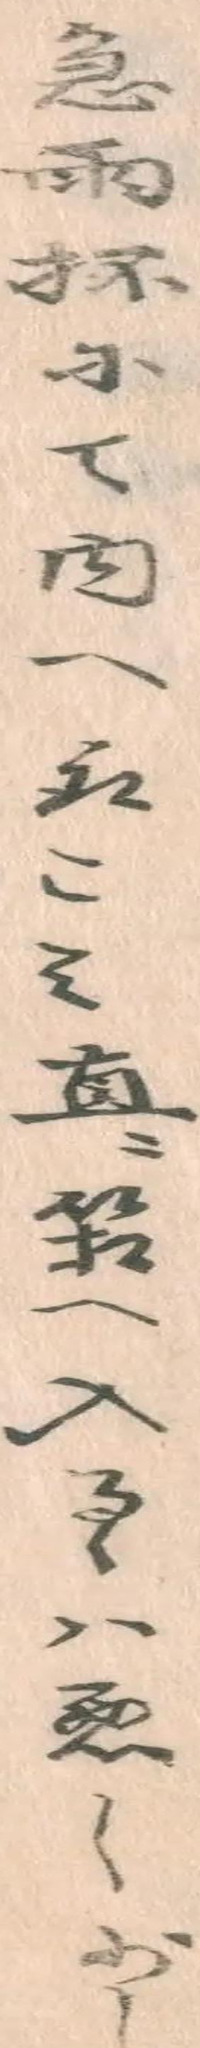急雨抔にて内へ取こみ直に箱へ入るゝは悪し少し
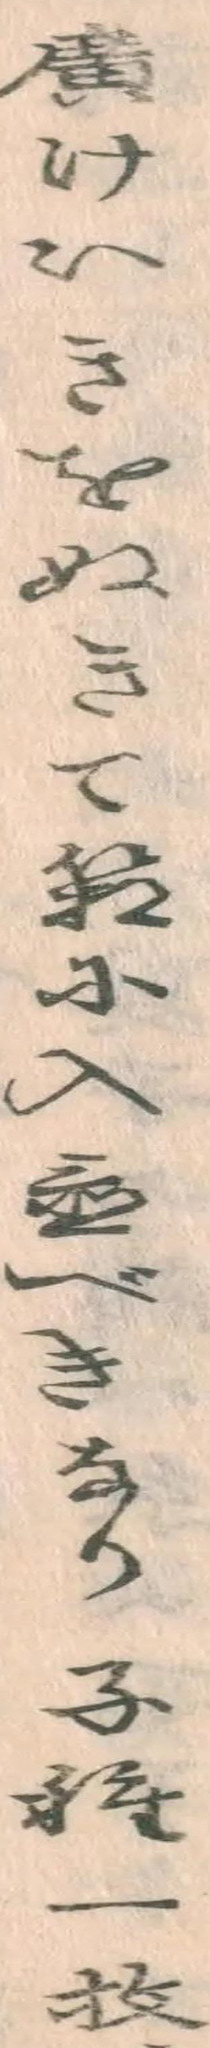広けいきをぬきて箱に入置べきなり子種一枚に
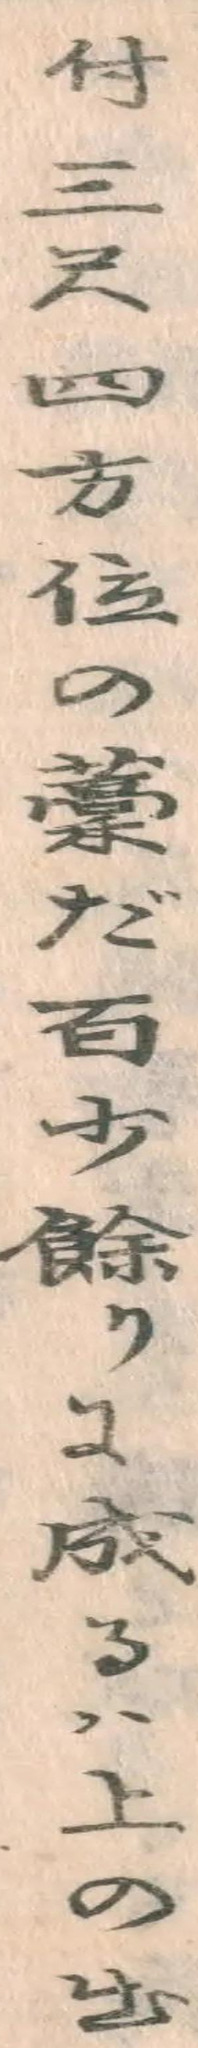付三尺四方位の藁だ百少余りに成るは上の出
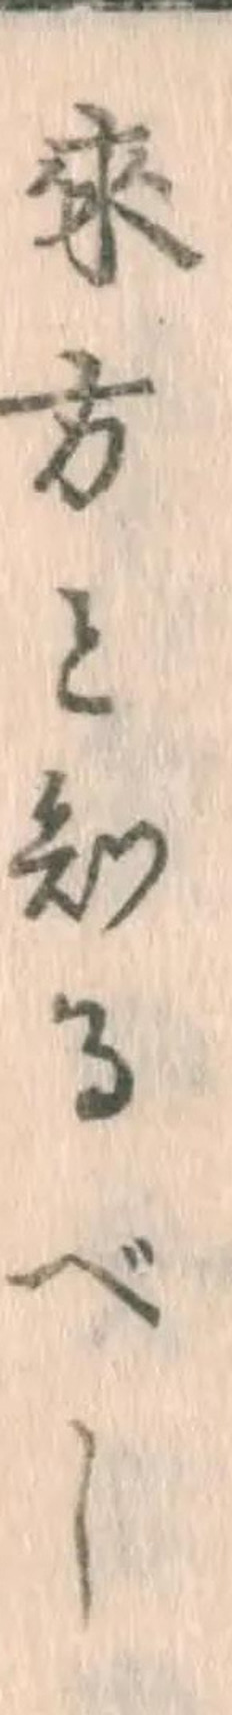来方と知るべし
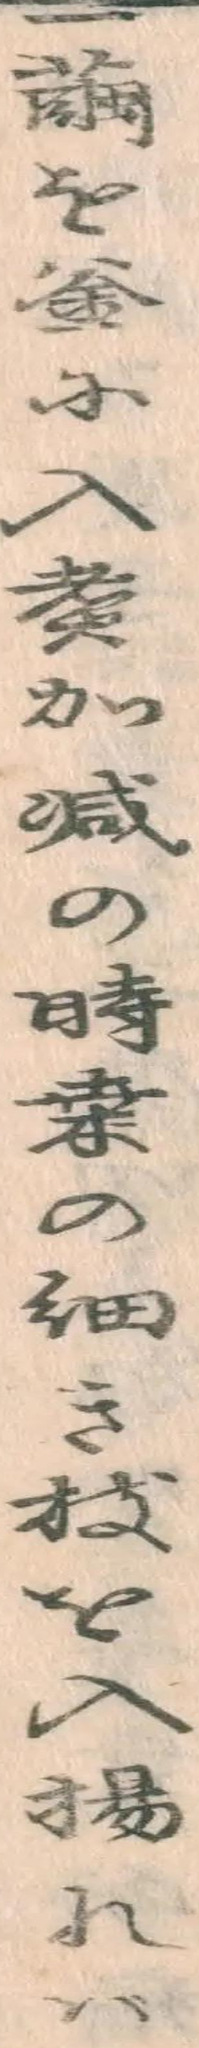一繭を釜に入煮加減の時桑の細き枝を入揚れは
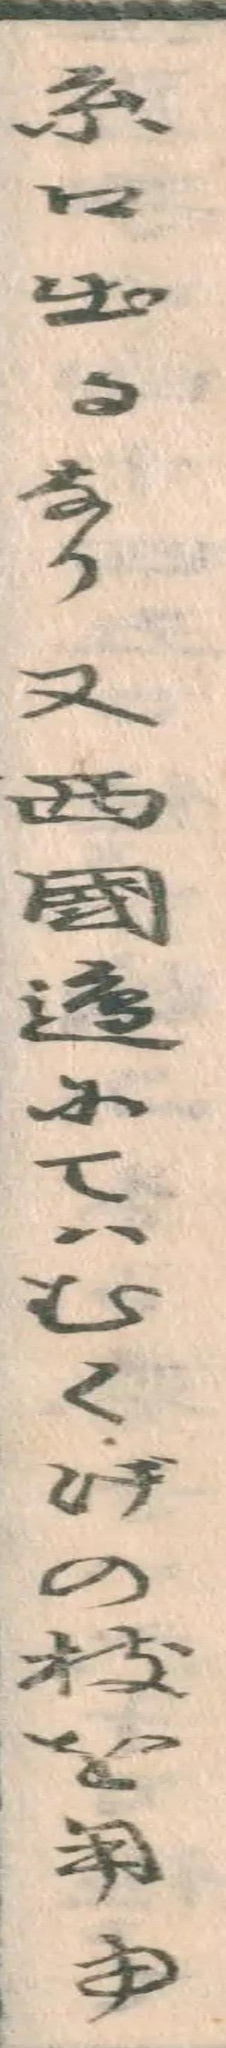糸口出るなり又西国辺にてはむくげの枝を用ゆ
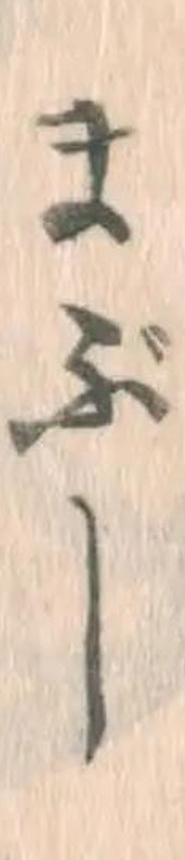まぶし
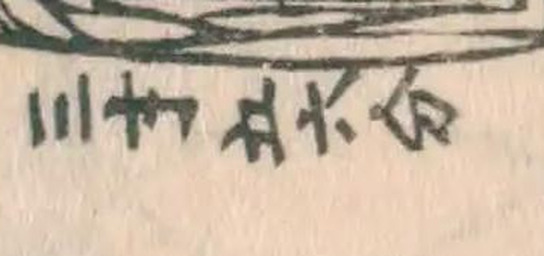三寸五六分
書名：機織彙編 5巻. [1]
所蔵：国立国会図書館 National Diet Library, JAPAN
